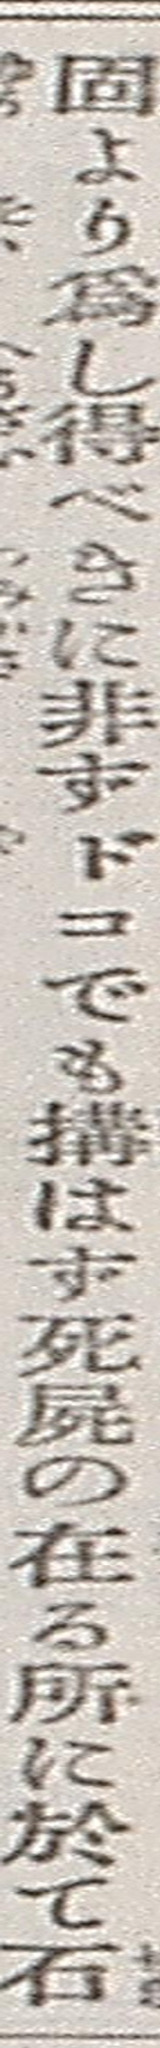固より為し得べきに非ずドコでも構はず死屍の在る所に於て石
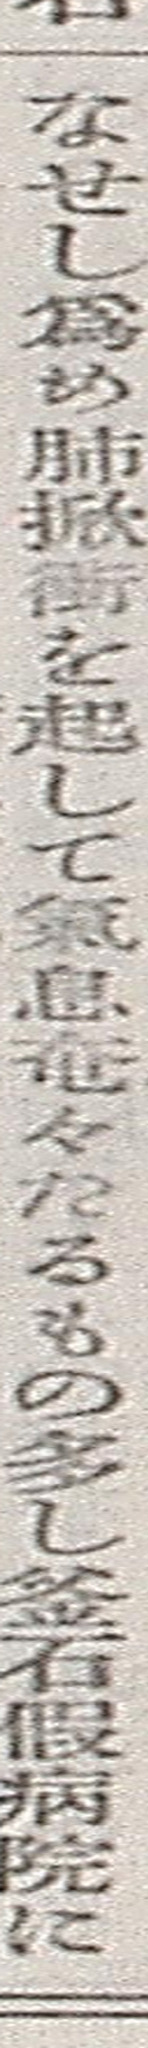なせし為め肺掀衝を起して気息奄々たるもの多し釜石仮病院に
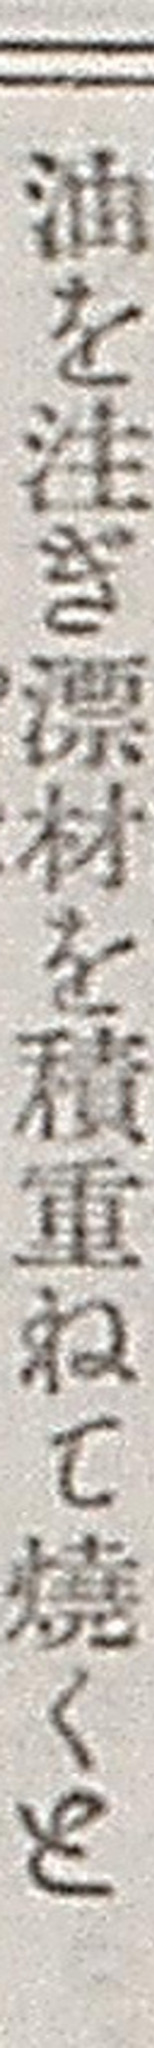油を注ぎ漂材を積重ねて焼くと
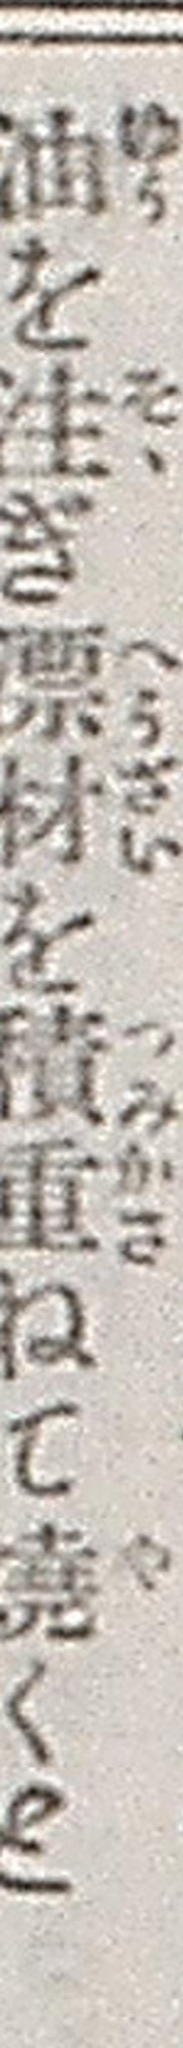油を注ぎ漂材を積重ねて焼くと
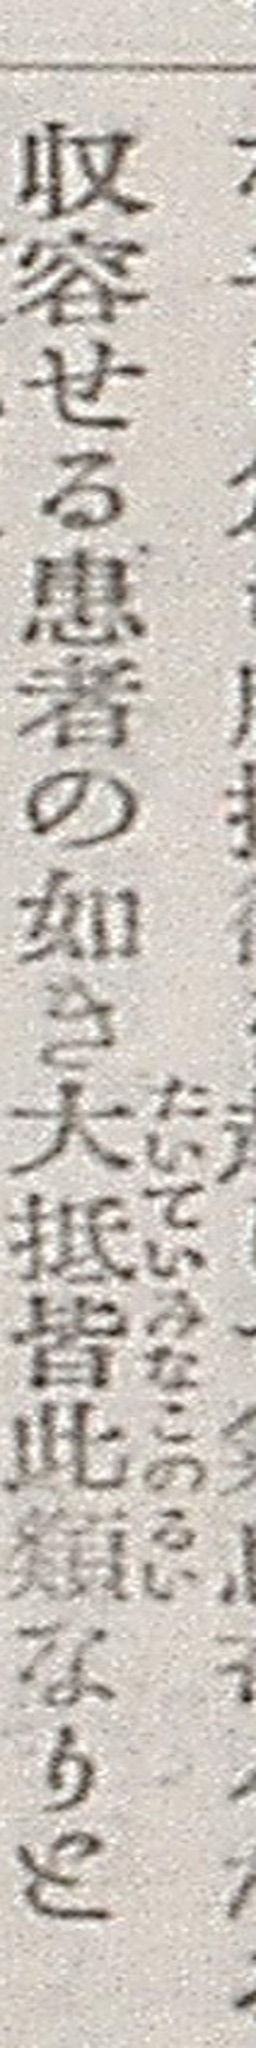収容せる患者の如き大抵皆此類なりと
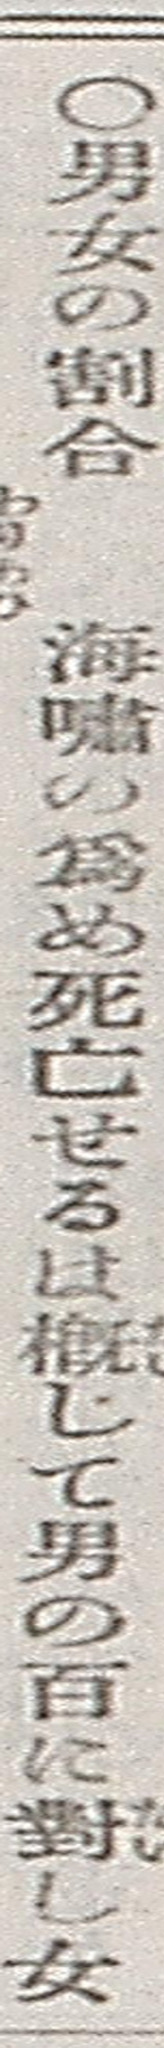○男女の割合海嘯の為め死亡せるは概して男の百に対し女
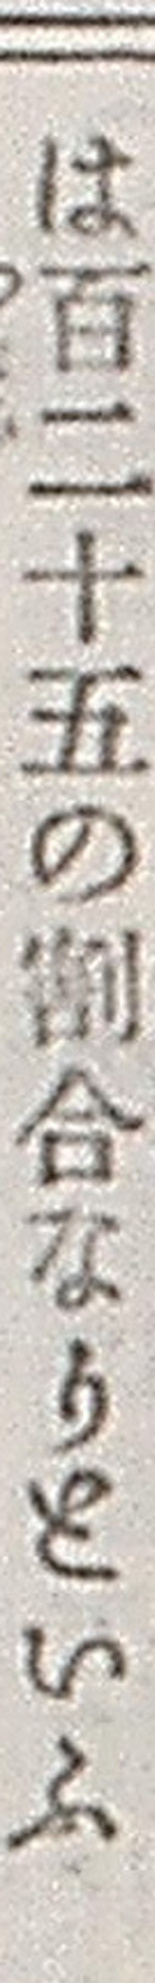は百二十五の割合なりといふ
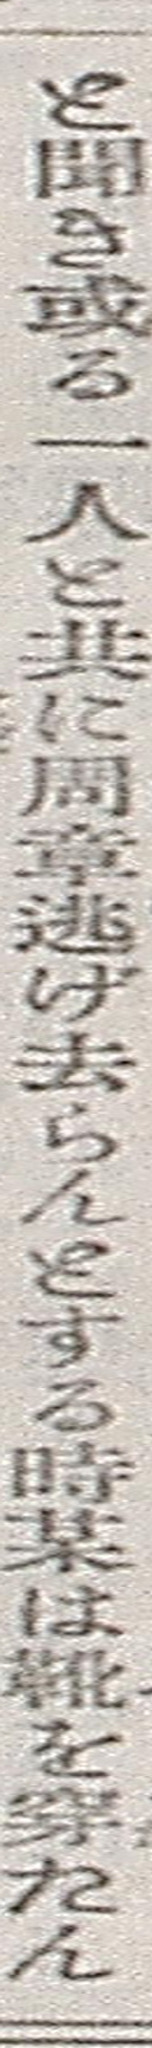と聞き或る一人と共に周章逃げ去らんとする時某は靴を穿たん
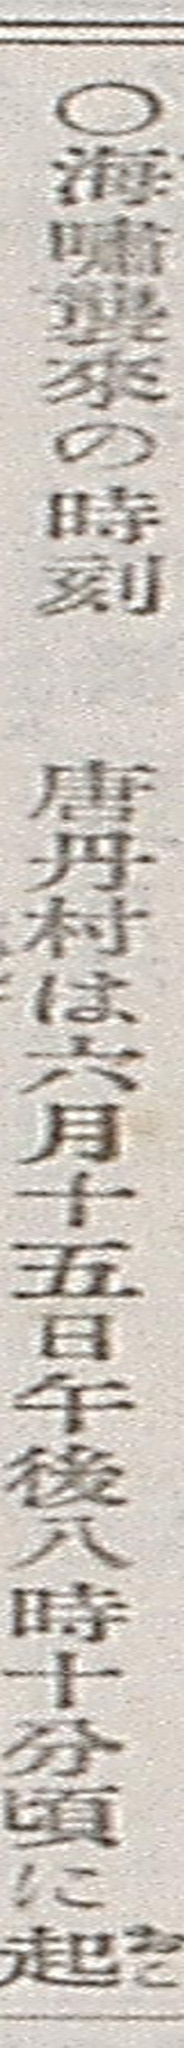○海嘯襲来の時刻唐丹村は六月十五日午後八時十分頃に起
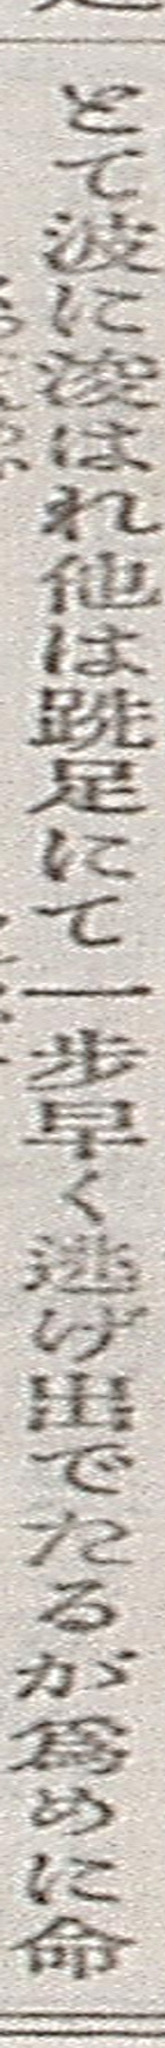とて波に浚はれ他は跣足にて一歩早く逃げ出でたるが為めに命
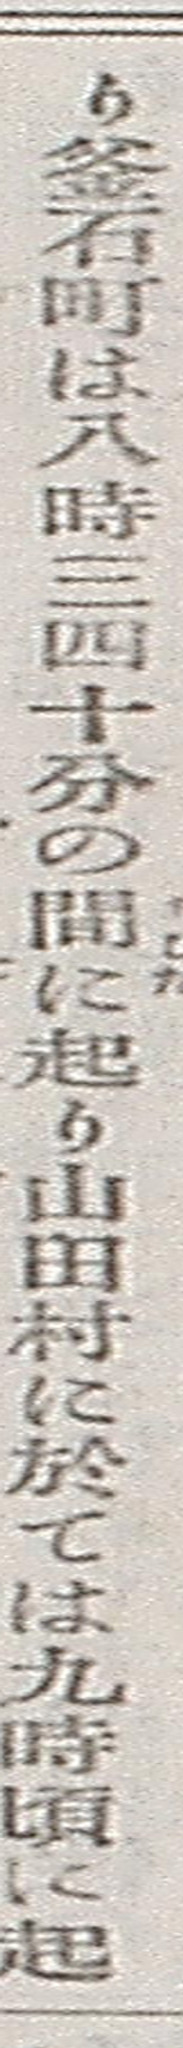り釜石町は八時三四十分の間に起り山田村に於ては九時頃に起
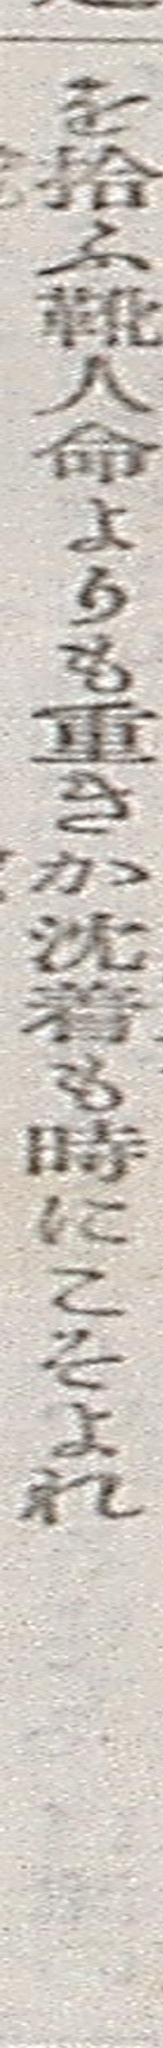を拾ふ靴人命よりも重きか沈着も時にこそよれ
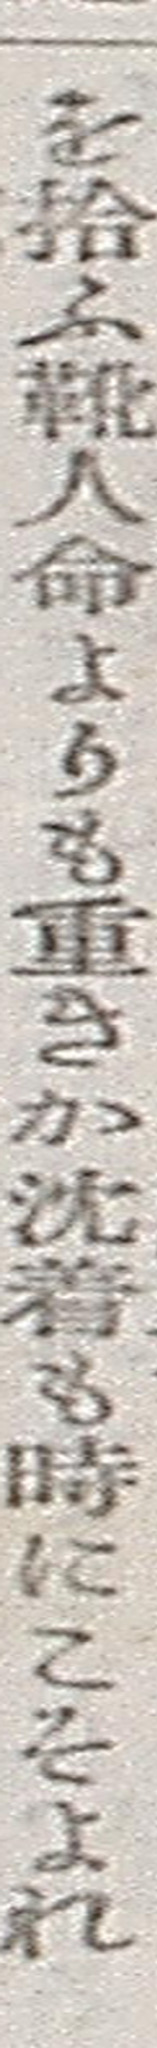を拾ふ靴人命よりも重きか沈着も時にこそよれ
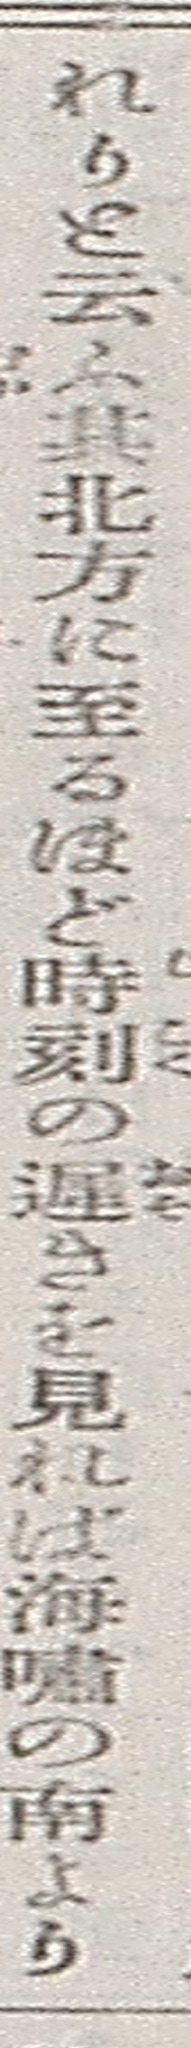れりと云ふ其北方に至るほど時刻の遅きを見れば海嘯の南より
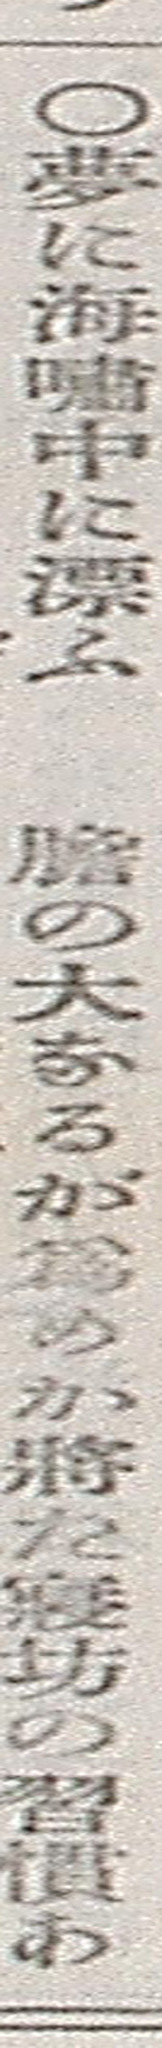○夢に海嘯中に漂ふ胆の大なるが為めか将た寝坊の習慣あ
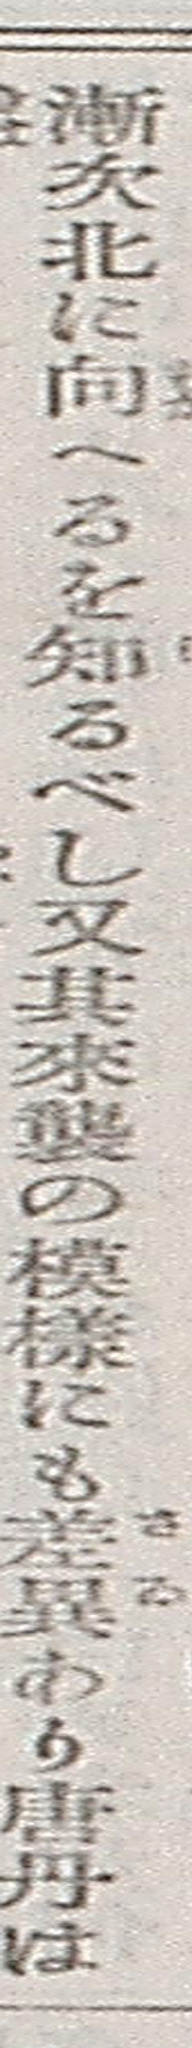漸次北に向へるを知るべし又其来襲の模様にも差異あり唐丹は
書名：風俗畫報臨時増刊第百二十號　大海嘯被害録（下）
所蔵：東京大学地震研究所図書室 Earthquake Research Institute Library, The University of Tokyo, JAPAN
